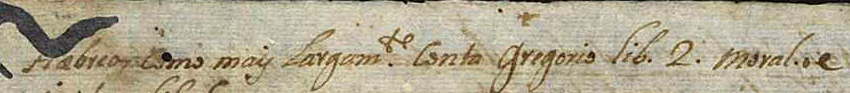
Hebreos como mais Largam.te conta Gregorio Lib. 2. moral. de
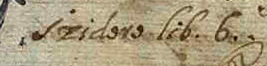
Izidoro lib.6.
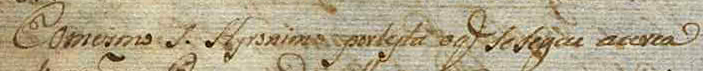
E o mesmo S. Hyronimo portesta o q̄ se segue acerca
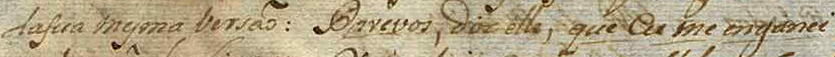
da sua mesma versaõ: Parevos, diz elle, que Eu me enganei
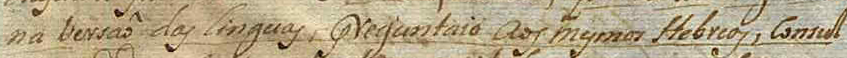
na versaõ das linguas, preguntaio aos mesmos Hebreos, consul
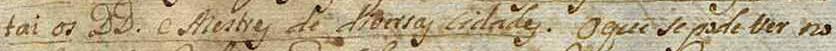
tai os DD. e Mestres de diversas cidades. O que se pode ver no
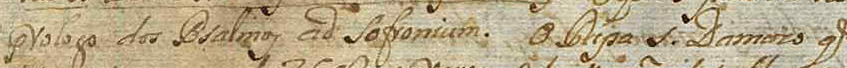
prologo dos Psalmos ad Sofronium. O Ripa s. Damazo q̄
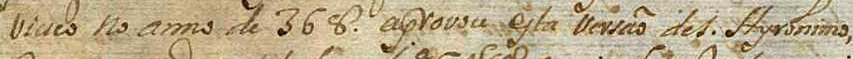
viueo no anno de 368. aprovou esta versão de s. Hyronimo,
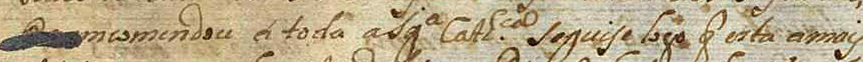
_mcomendou á toda a Iga Cath.ca seguise logo q̄ esta a mais
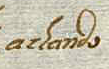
achando
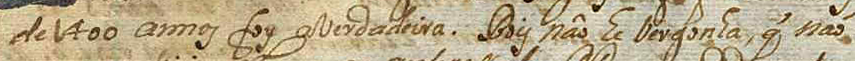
de 1400 annos foy a verdadeira. Pois não he vergonha, q̄ naõ
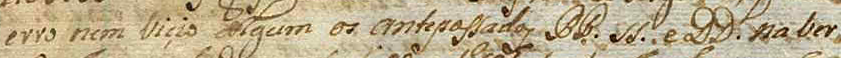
erro nem viçio algum os antepassados PP. ss. e DD. na ver
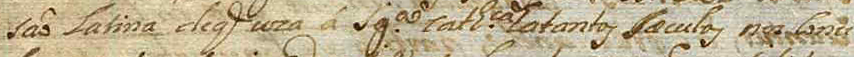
são Latina de q̄ uza a Ig.a cath.ca ha tantos seculos nos Conci
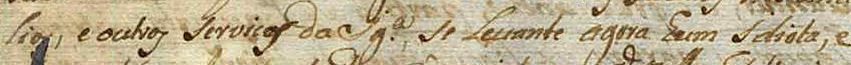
lios, e outros servicos da Ig.a se leuante agora hum Idiota, e
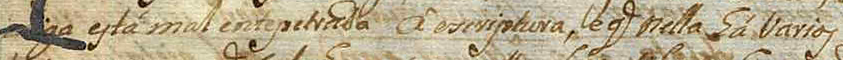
_ga está mal entepetrada a escriptura, e q̄ nella há varios
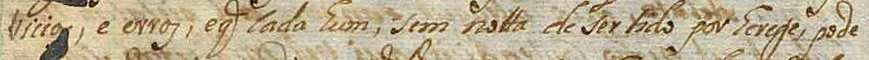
vicios, e erros, e q̄ cada hum, sem notta de ser tido por herege, pode
